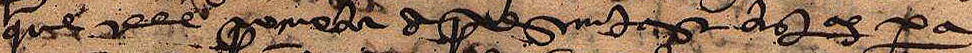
que elle promotor Ap̄esemtase testas ꝑa
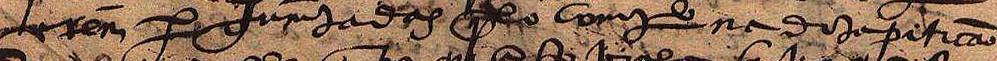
serem̄ ꝑgum̄tadas p̄lo comtdo na dita piticão
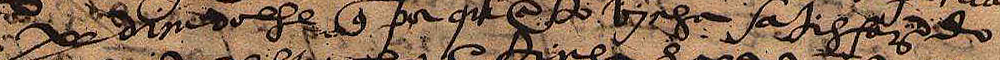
pedimdolhe q̄ porquāto vjnha satisfazēdo
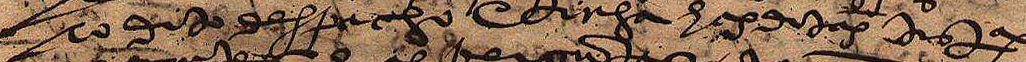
ao dito despacho e tinha has ditas testas
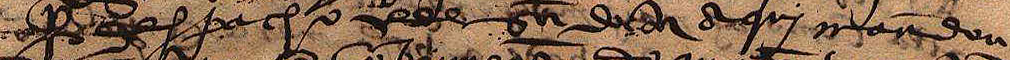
e despacho elle sōr doctor Aquj mandou
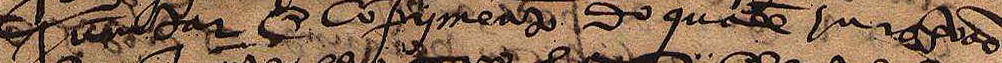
Jumtar ē Cōprjmento do quall Eu esp̄vão
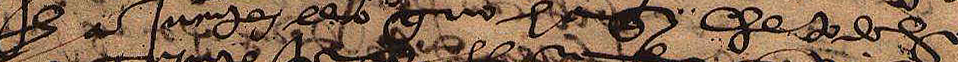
ha Jumtej lloguo haq̄j e he todo ho
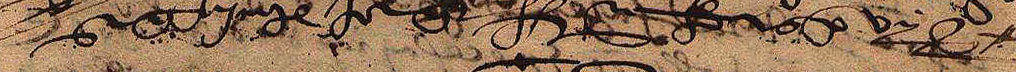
segujmte Jorge ffrra ho esp̄vy
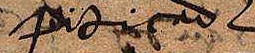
piticão
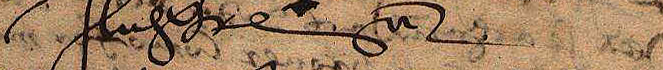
Jlustre sōr
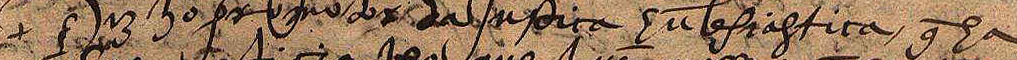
+ Diz ho promotor da Justica Ecclesiastica, q̄ ha
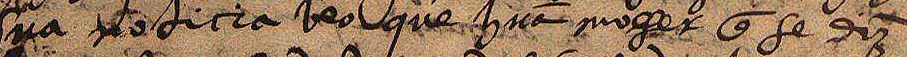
sua noticia veo que huā molher q̄ se diz̄
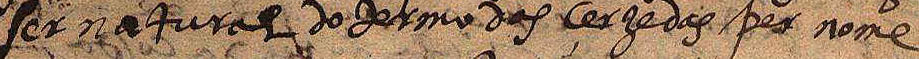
ser natural do termo das çerzedas per nome
